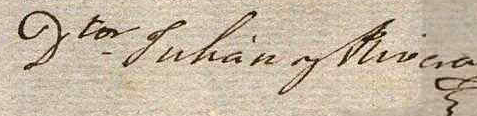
Dtor. Iulian y Rivera
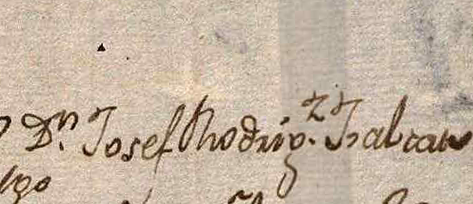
D.n Iosef Rodrig.z Falcato
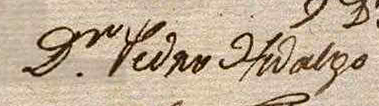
D.n Pedro Hidalgo
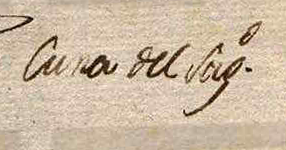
Cura del Sag.o
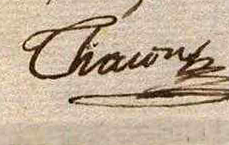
Chacon
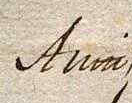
Auta
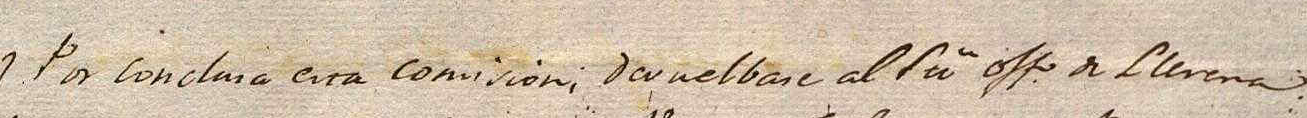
Por conclusa esta comision, devuelbase al Stō off.o de Llerena
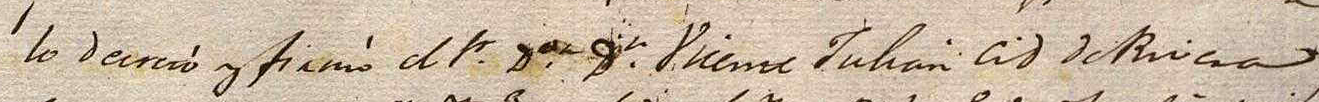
lo decretó y firmó el Sr. D.or D.n Vicente Iulian Cid de Rivera
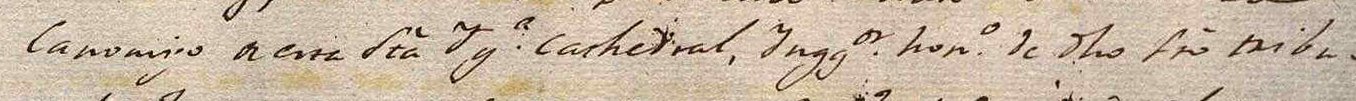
Canonigo de esta Stā Yg.a Cathedral, Inqq.or hon.o de dho Stō tribu
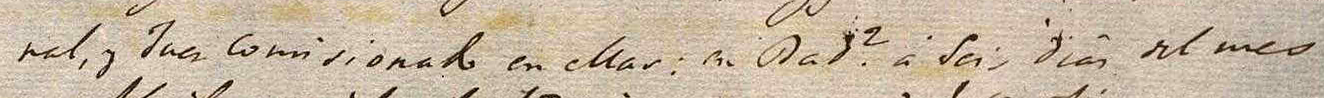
nal, y Iuez Comisionado en ellas: en Bad.z a seis dias del mes
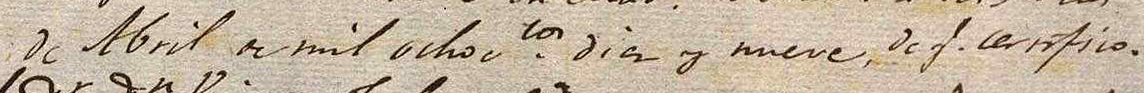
de Abril de mil ochoc.tos diez y nueve, de q.e certifico.
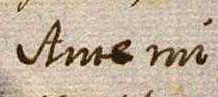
Ante mi
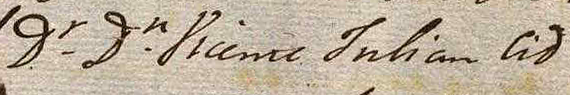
D.r D.n Vicente Iulian Cid
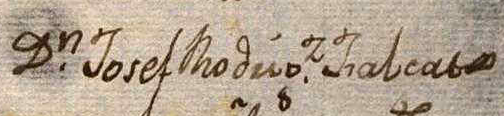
D.n Iosef Rodrig.z Falcato
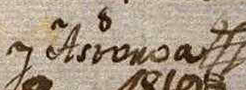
y Astorga
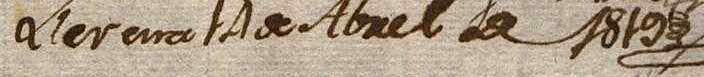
Llerena 14 de Abril de 1819
